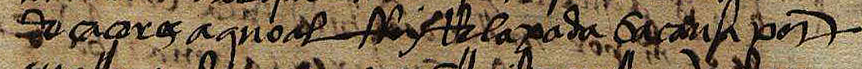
de caceres a quoaL ffoy Relaxada E a causa por
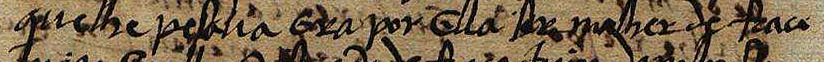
que lhe pesaua Era por Ella ser molher de fraco
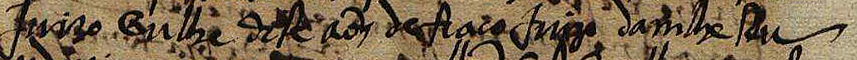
Juizo Eu lhe dise aos de fraco Juizo damlhe seu
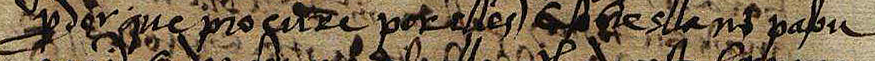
ꝓdor que procure por elles E sobre Ella nō pasou
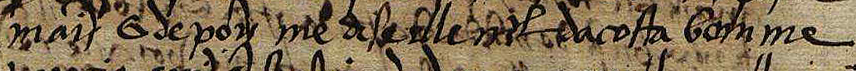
mais E depois me dise elle mel da costa bem me
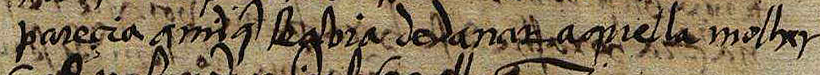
parecia a mī q̄ se avia de danar aquella molher
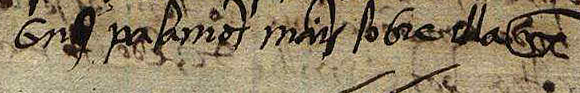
En q̄ pasamos mais sobre Ella c̄ꝭ
